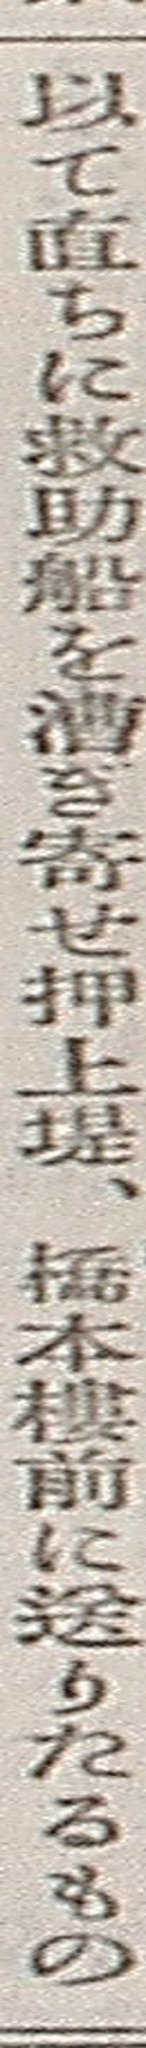以て直ちに救助船を漕ぎ寄せ押上堤、橋本楼前に送りたるもの
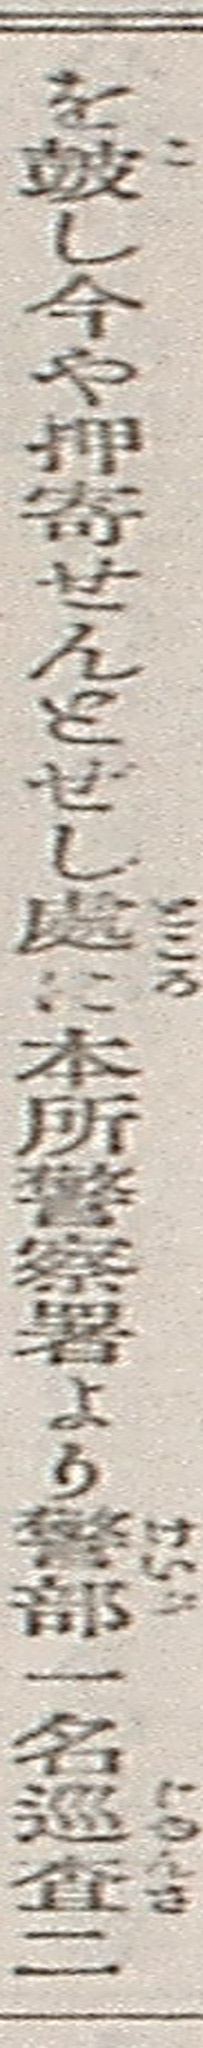を鼓し今や押寄せんとせし処に本所警察署より警部一名巡査ニ
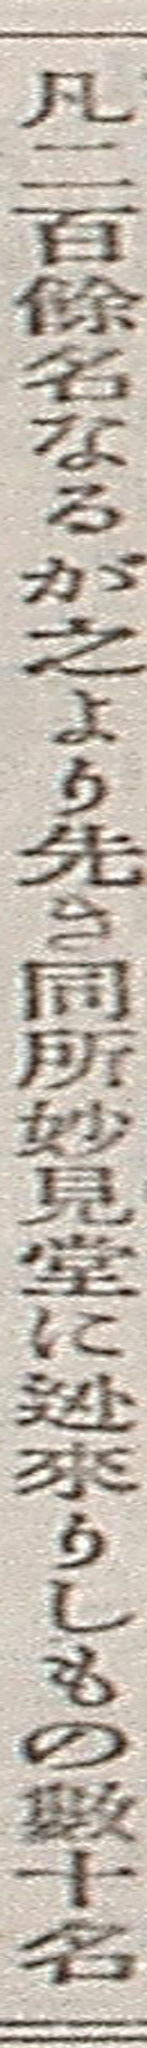凡二百余名なるが之より先き同所妙見堂に逃来りしもの数十名
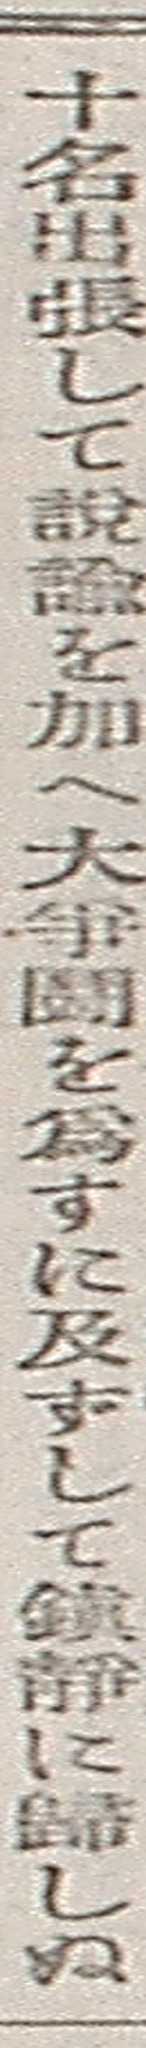十名出張して説諭を加へ大争闘を為すに及ずして鎮静に帰しぬ
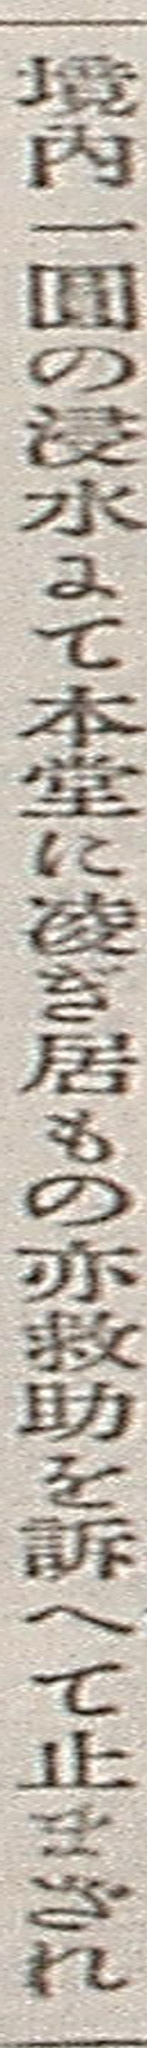境内一円の浸水にて本堂に凌ぎ居もの亦救助を訴へて止まざれ

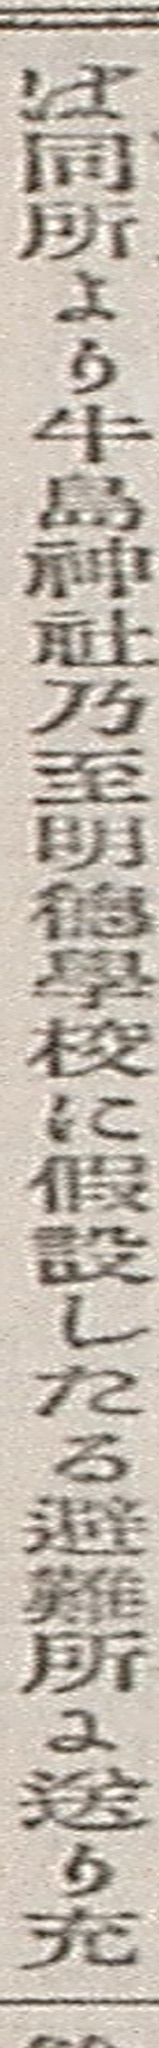は同所より牛島神社乃至明徳学校に仮設したる避難所に送り充
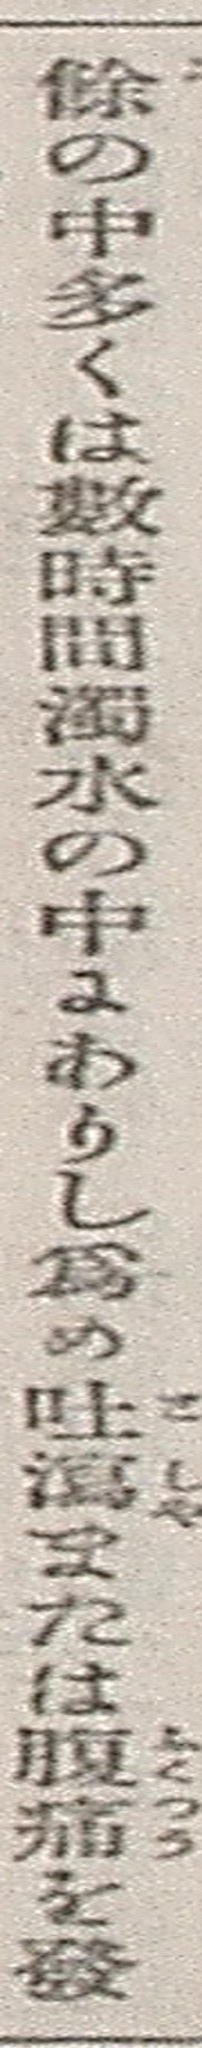余の中の多くは数時間の中にありし為め吐瀉または腹痛を発
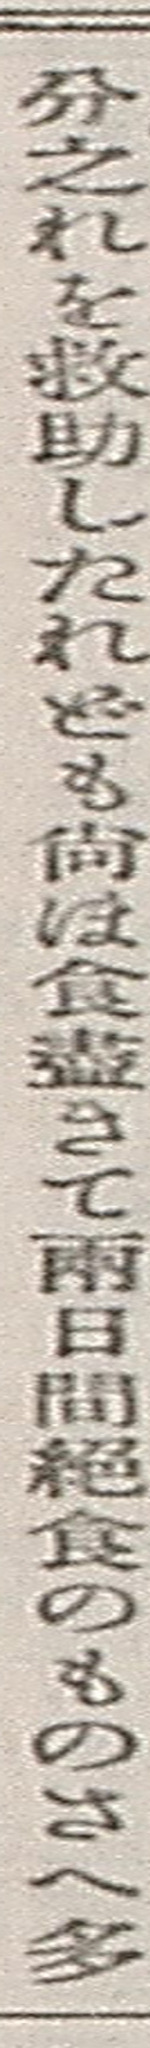分之れを救助したれども尚ほ食尽きて両日間絶食のものさへ多
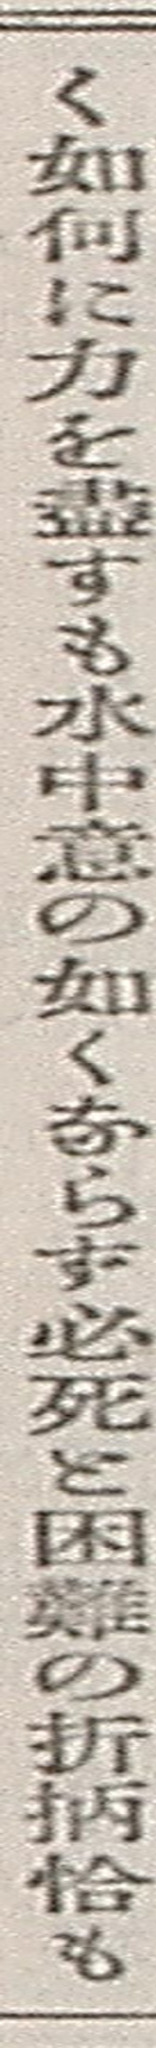く如何に力を尽すも水中意の如くならず必死と困難の折抦恰も
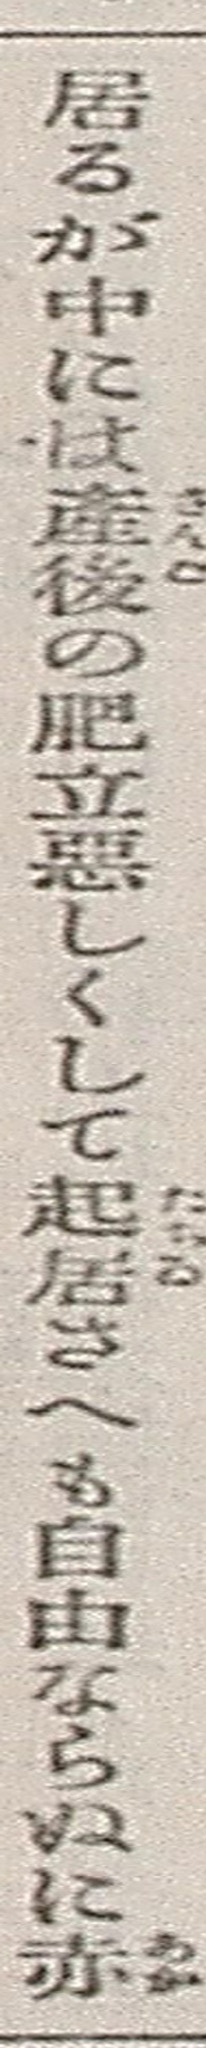居るが中には産後の肥立悪しくして起居さへも自由ならぬに赤
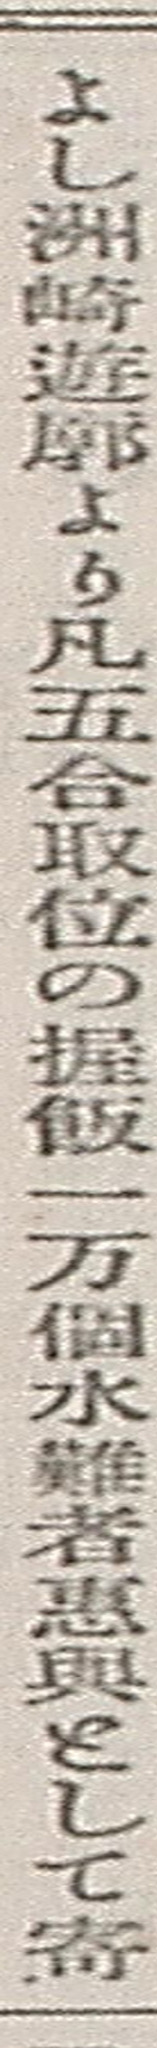よし洲崎遊郭より凡五合取位の握飯一万個水難者恵与として寄
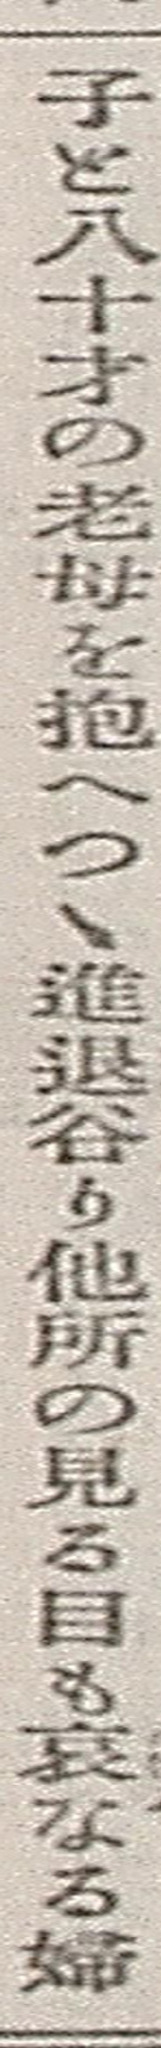子と八十才の老母を抱へえつヽ進退谷り他所の見る目も哀なる婦
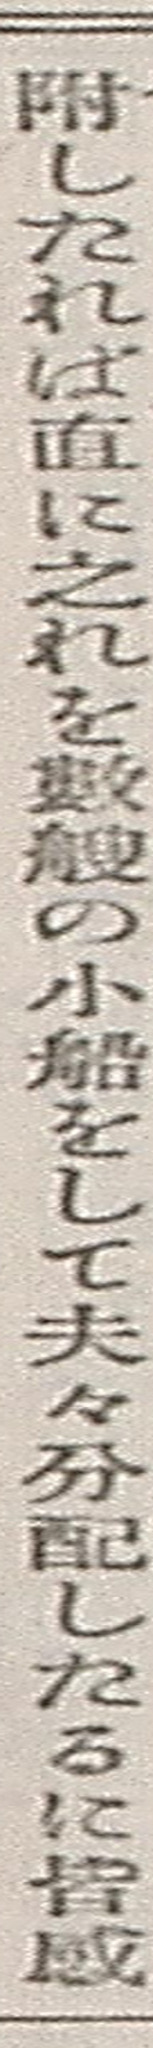附したれば直に之れを数艘の小船をして夫々分配したるに皆感
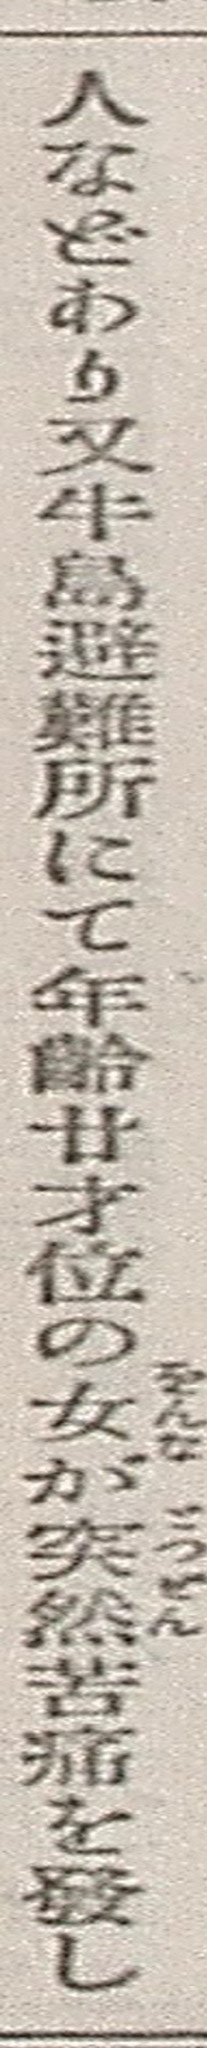人などあり又牛島避難所にて年齢廿才位の女が突然苦痛を発し
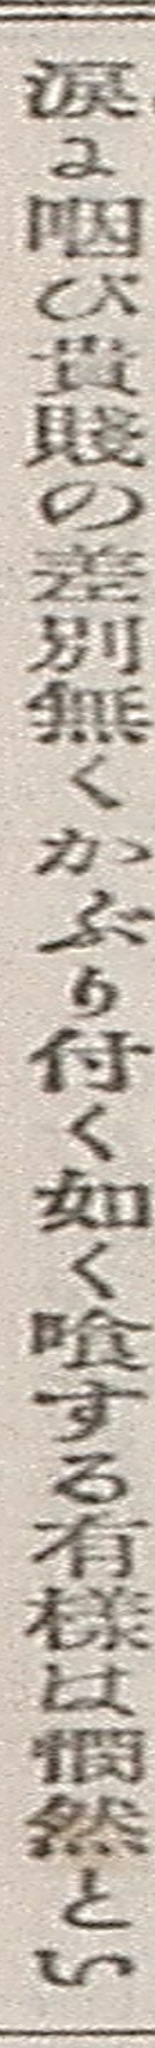涙に咽び貴賤の差別無くかぶり付く如く喰する有様は憫然とい
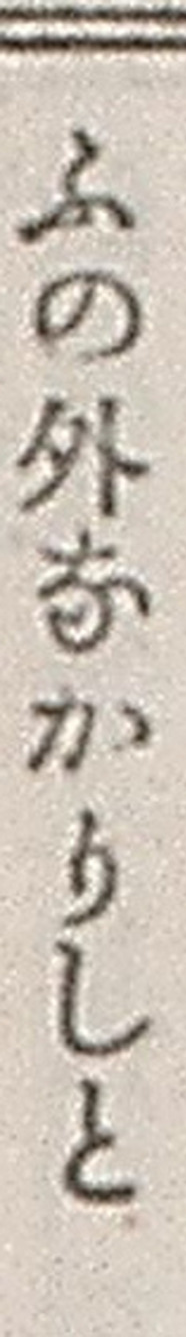ふの外なかりしと
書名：風俗畫報臨時増刊第百二十四號　洪水地震被害録（上）
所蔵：東京大学地震研究所図書室 Earthquake Research Institute Library, The University of Tokyo, JAPAN
